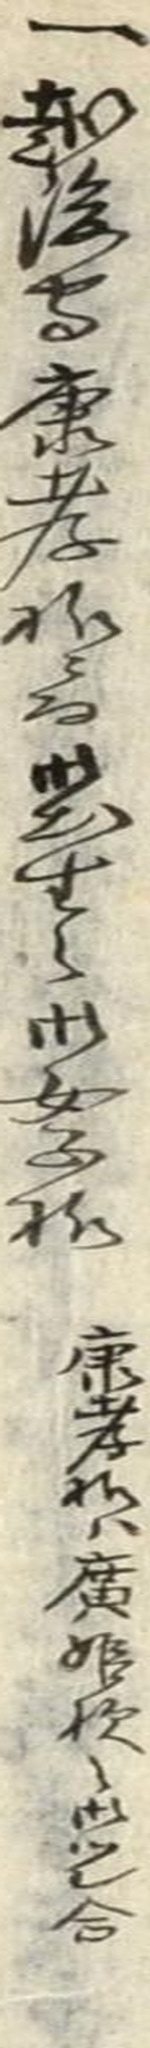一越後守康孝様にて御出生之御女子様康孝様は広姫様之御ツレ合
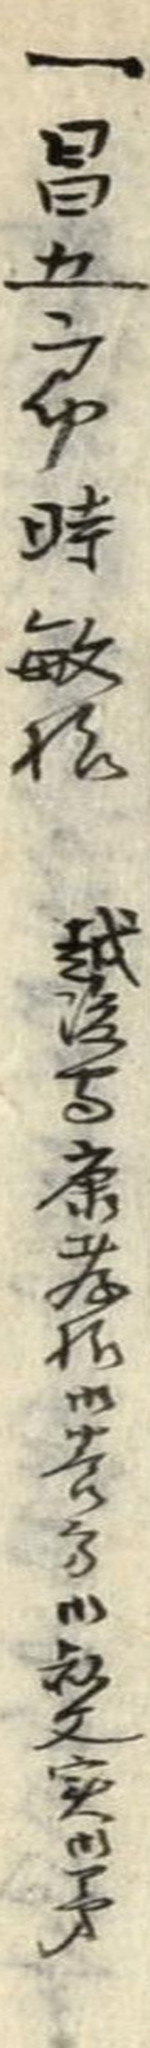一昌五郎時敏様越後守康孝様御養方御叔父実御弟
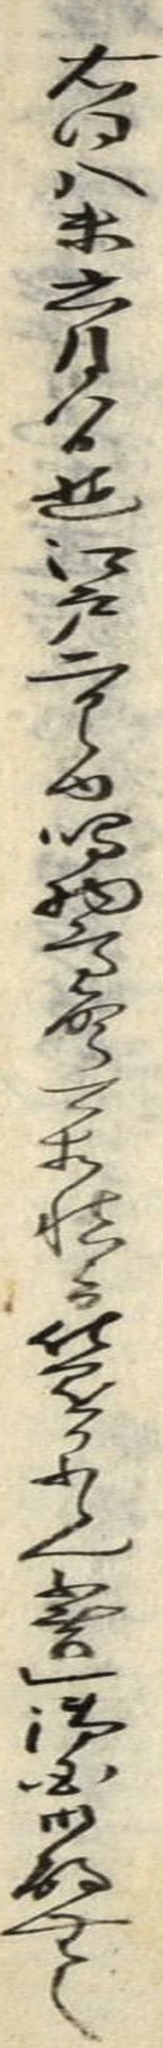右同八未六月八日逝江戸二日之内鳴物高声可相慎旨仕懸りふしん不苦」御国御触無之

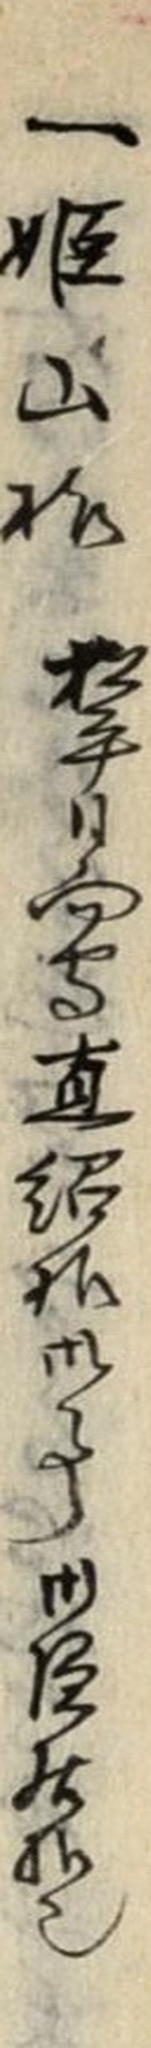一姫山様松平日向守直紹様御事御隠居様也
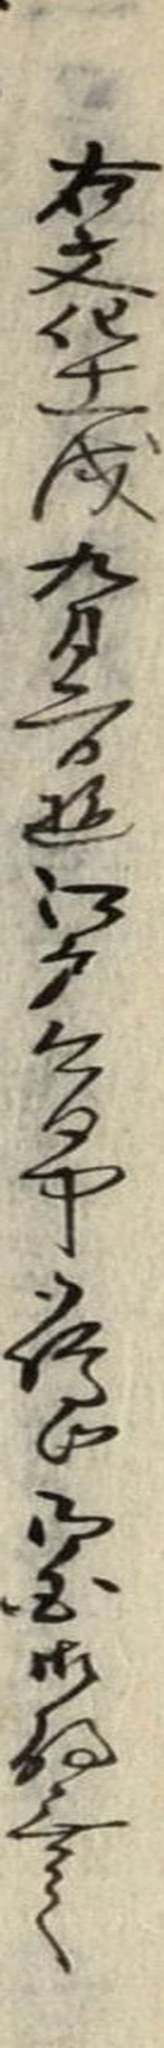右文化十一戌九月二日逝去江戸今日中御停止御国御触無之
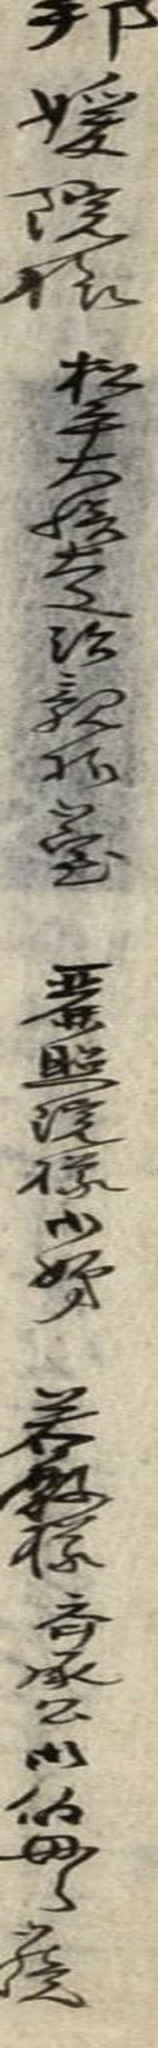一邦媛院様松平大膳大夫治親様御室麗照院様御姉若殿様斉承公御伯母之御続
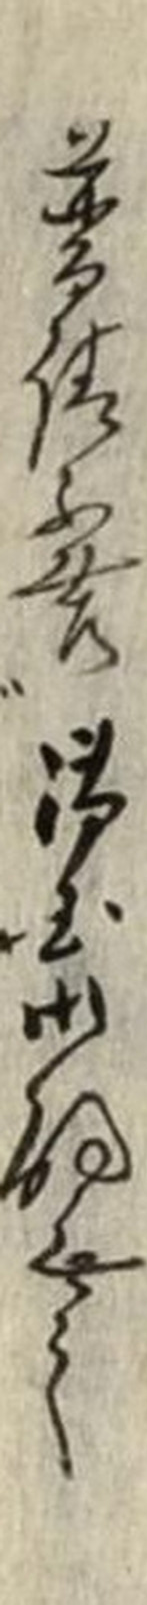普請不苦御国御触無之
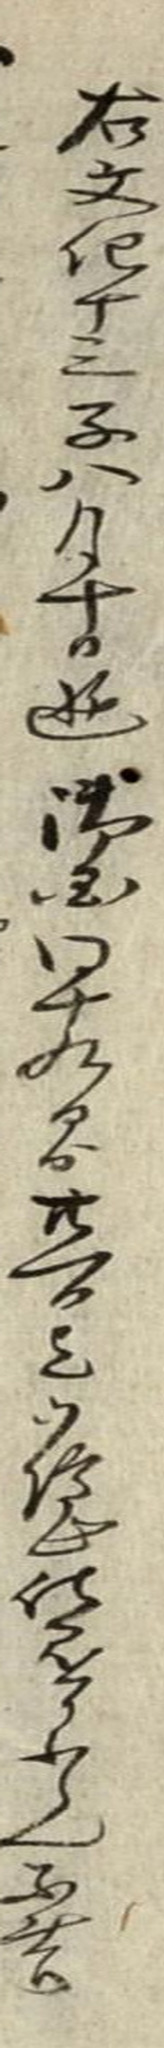右文化十三子八月十日逝御国同十九日ゟ廿一日迄御停止仕懸りふしん不苦
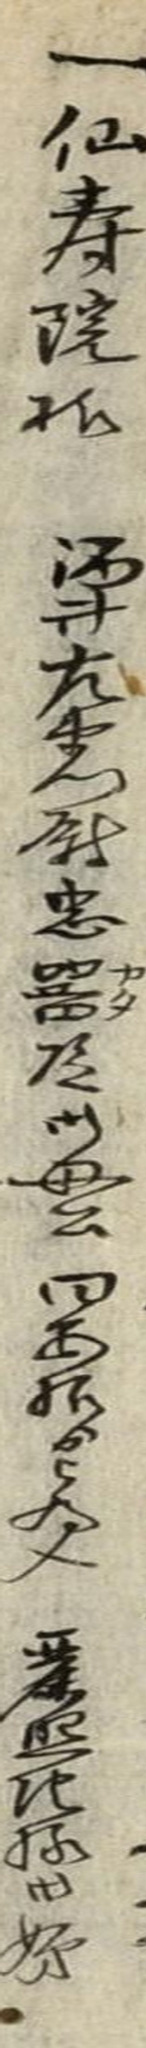一仙寿院様酒井左衛門尉忠器殿御母公田安様ゟ被為入麗照院様御姉
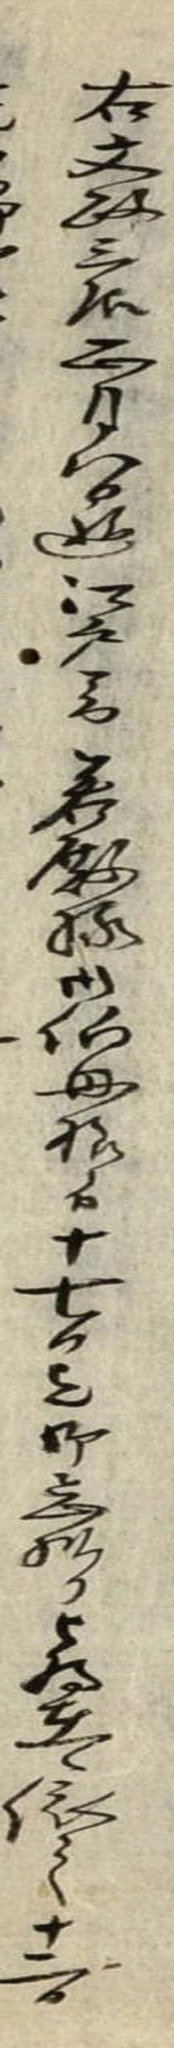右文化三辰正月八日逝江戸にて若殿様御伯母様に付十七日迄御忌掛り被為在候依之十二日
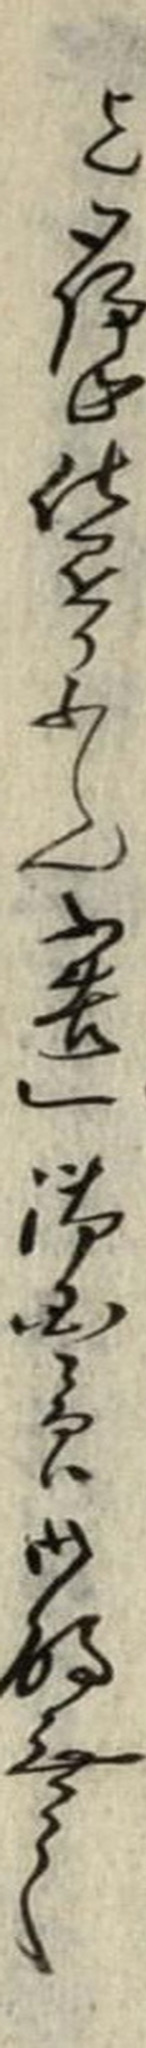迄御停止仕懸りふしん不苦」御国にては御触無之
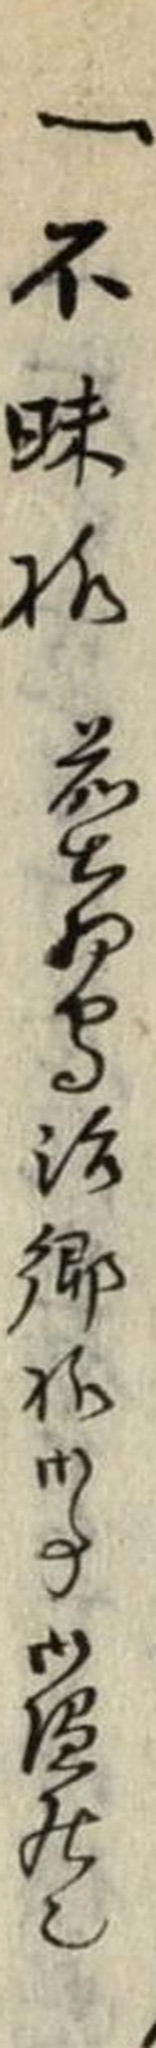一不昧様前出羽守治郷様御事御隠居也
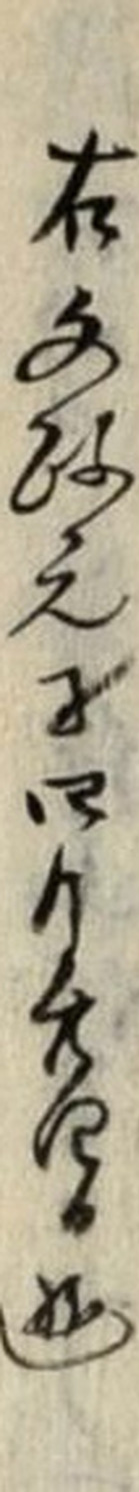右文化元刁四月廿四日逝
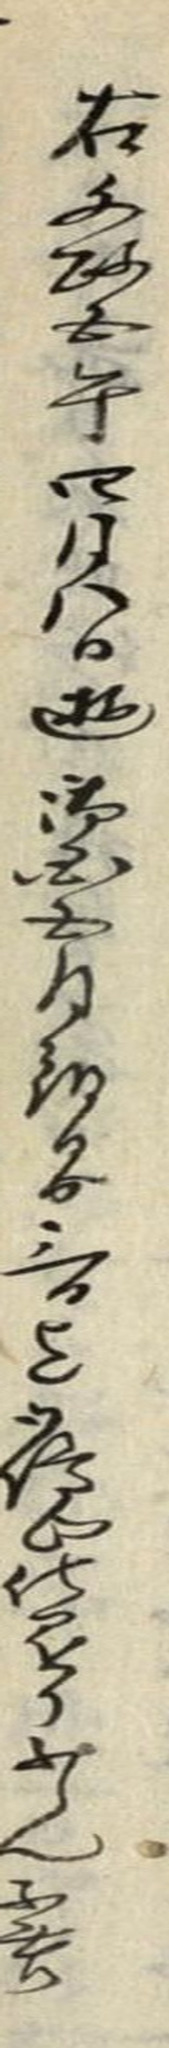右文政五午四月八日逝御国五月朔日ゟ三日迄御停止仕懸りふしん不苦
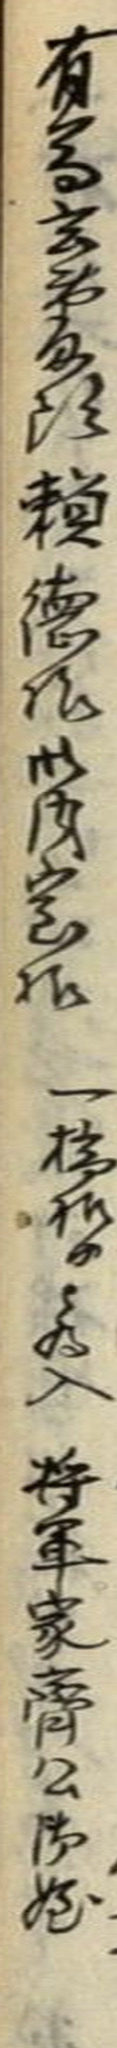一有馬玄蕃頭頼徳様御内室様一橋様ゟ被為入将軍家斉公御姪
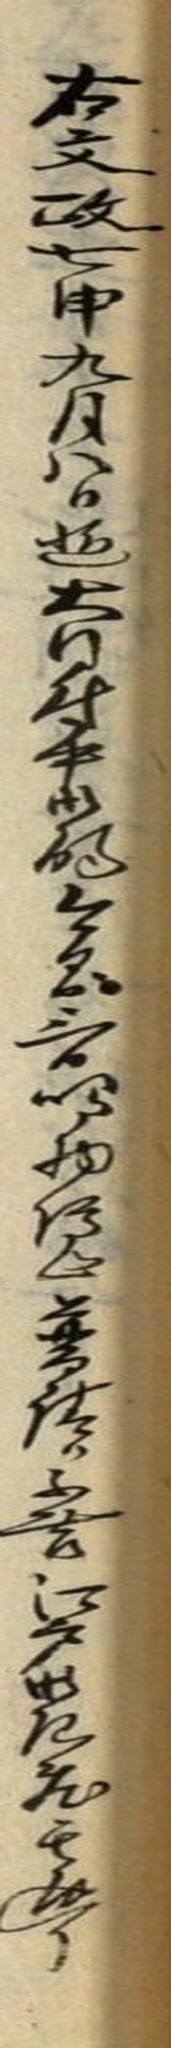右文政七申九月八日逝大目付中御触今日ゟ三日鳴物停止普請は不苦江戸御屋敷其通り
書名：御停止異変死失
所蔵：福井県文書館 Fukui Prefectural Archives
